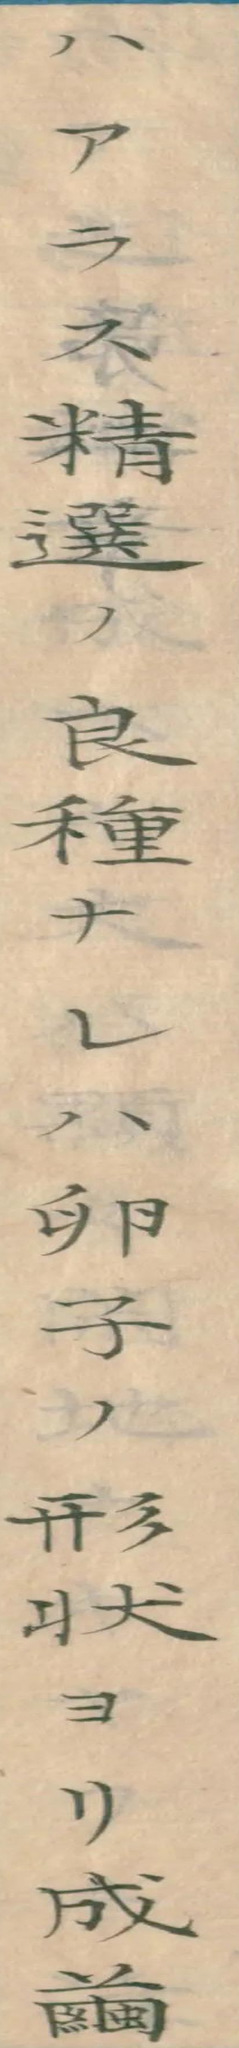ハアラス精選ノ良種ナレハ卵子ノ形状ヨリ成繭
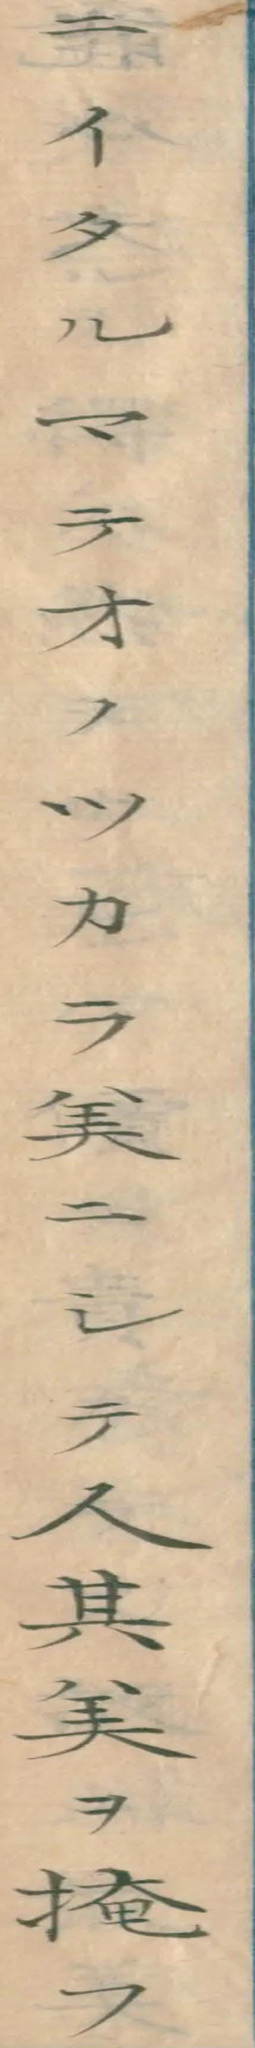ニイタルマテオノツカラ美ニシテ人其美ヲ掩フ

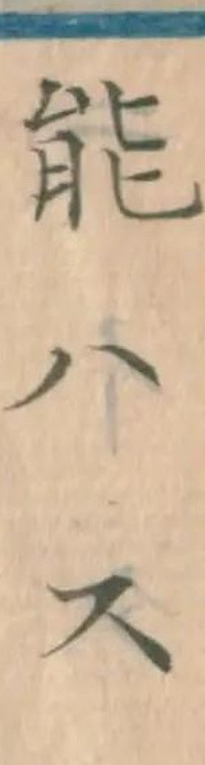能ハス
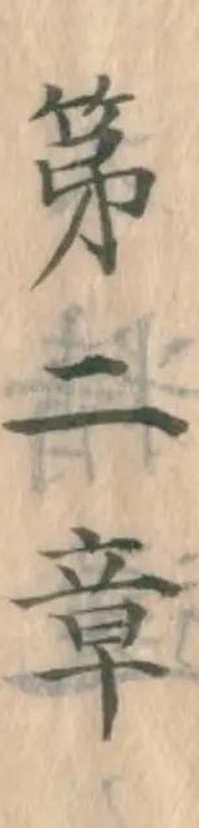第二章
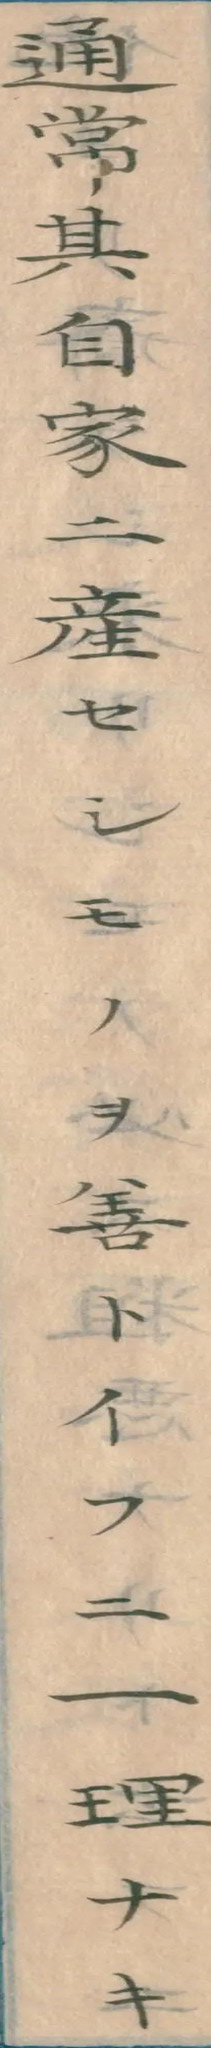通常其自家ニ産セシモノヲ善トイフニ一理ナキ
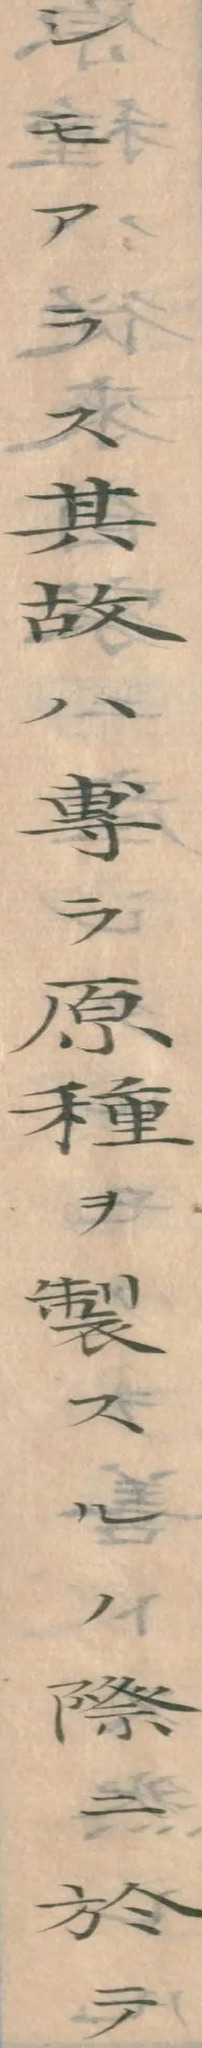シモアラス其故ハ専ラ原種ヲ製スルノ際ニ於テ
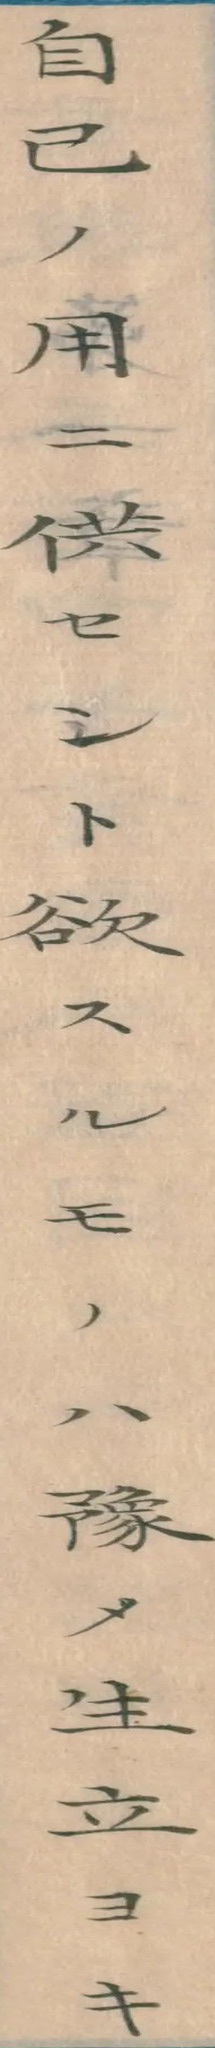自己ノ用ニ供セント欲スルモノハ予メ生立ヨキ
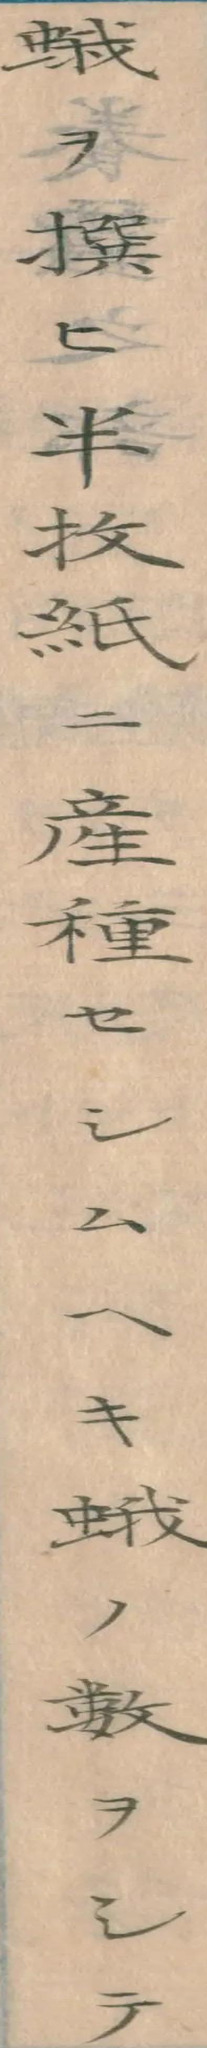蛾ヲ撰ヒ半枚紙ニ産種セシムヘキ蛾ノ数ヲシテ
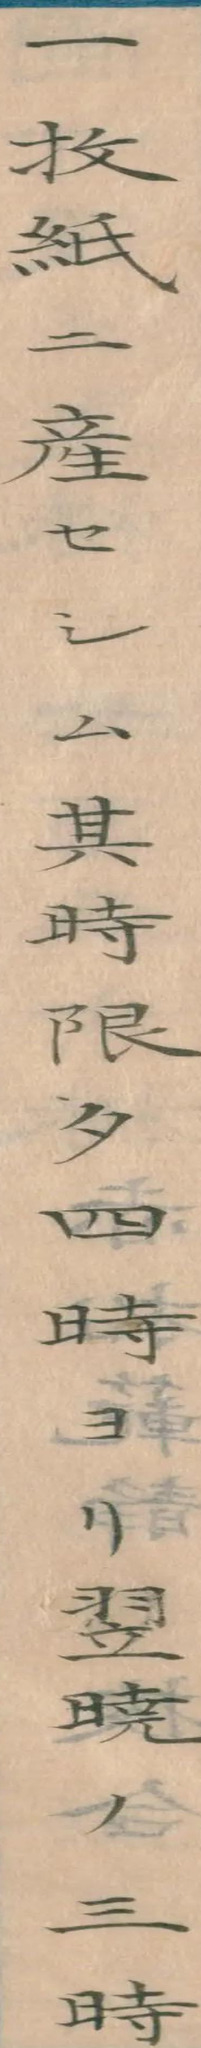一枚紙ニ産セシム其時限夕四時ヨリ翌暁ノ三時
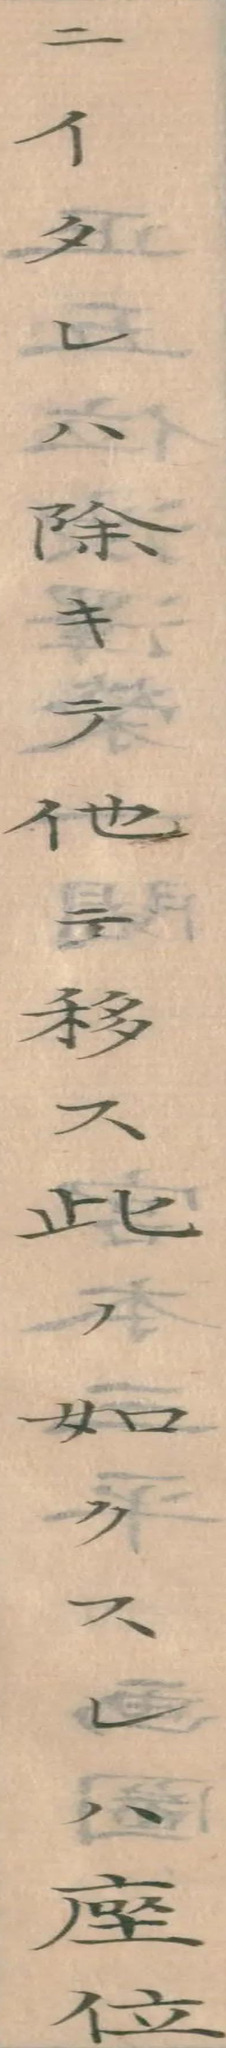ニイタレハ除キテ他ニ移ス此ノ如クスレハ座位
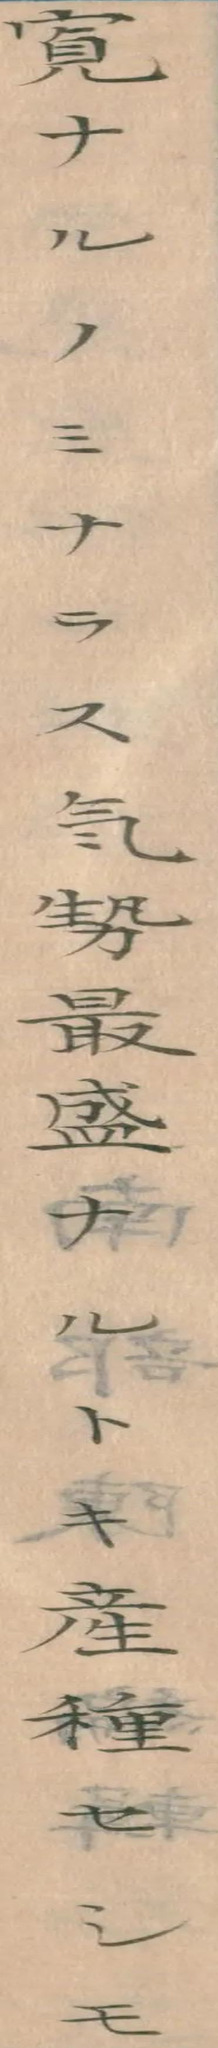寛ナルノミナラス気勢最盛ナルトキ産種セシモ
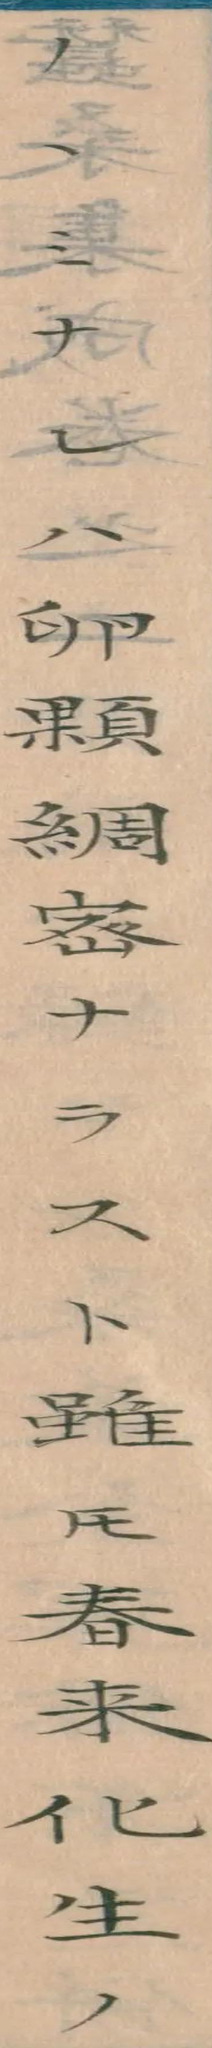ノヽミナレハ卵顆綢密ナラスト雖トモ春来化生ノ
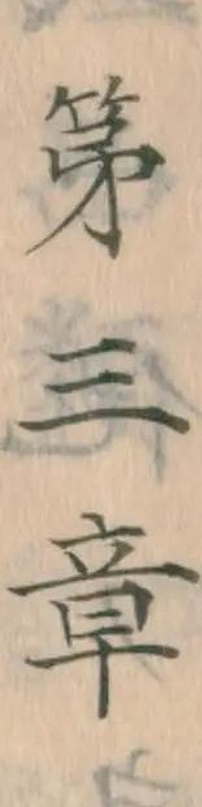第三章
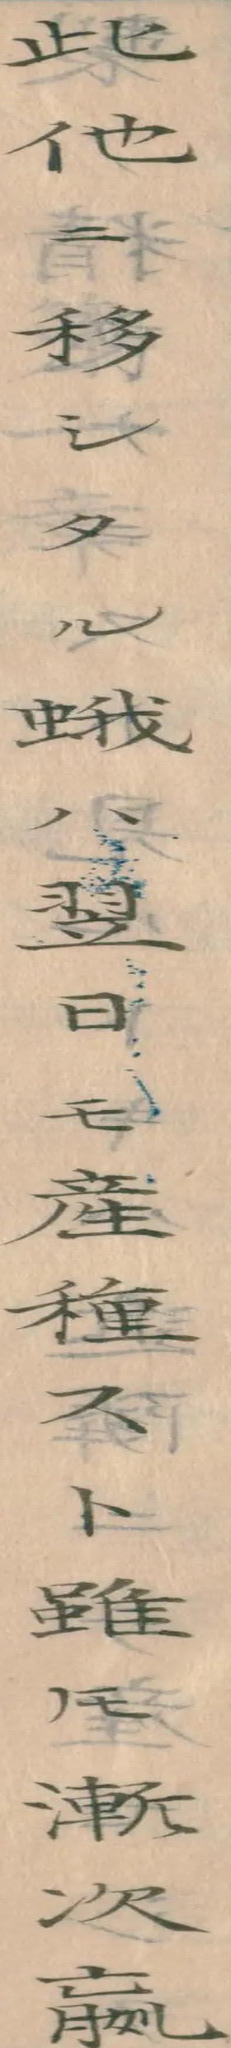此他ニ移シタル蛾ハ翌日モ産種スト雖トモ漸次嬴
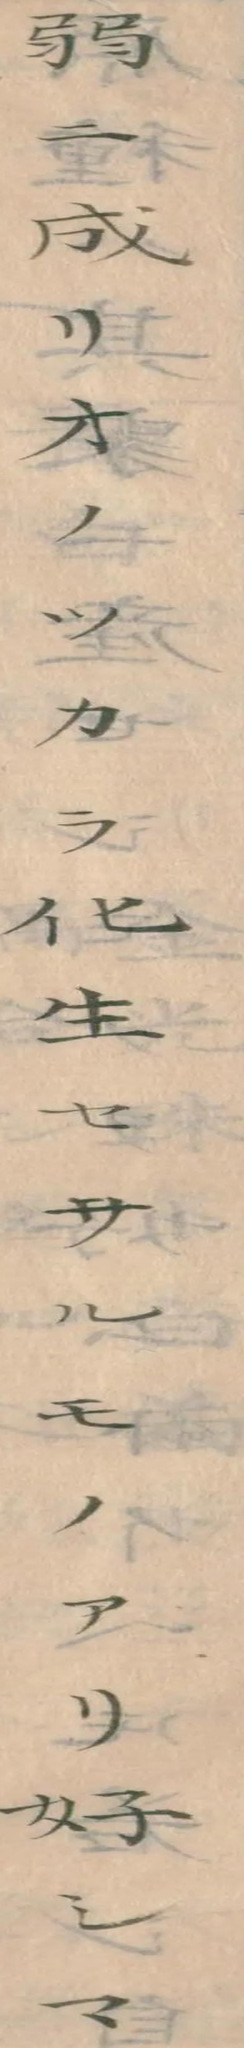弱ニ成リオノツカラ化生セサルモノアリ好シマ
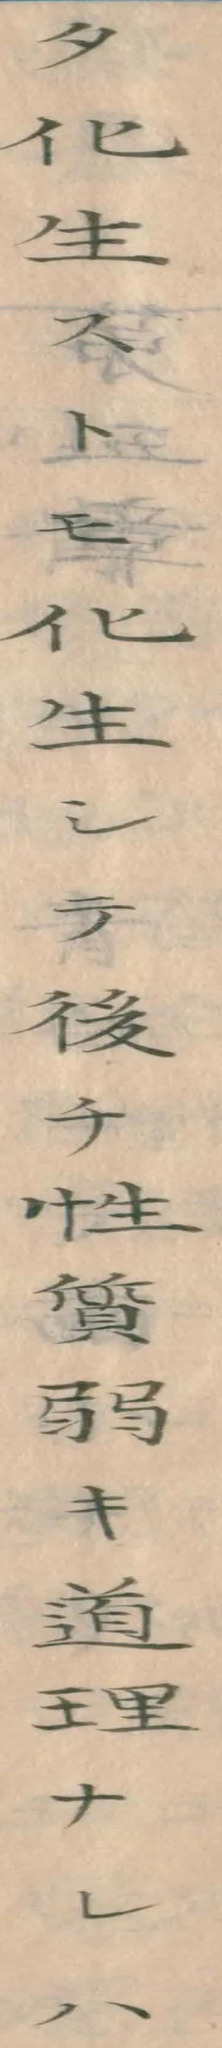タ化生ストモ化生シテ後チ性質弱キ道理ナレハ
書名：蚕桑集成
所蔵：国立国会図書館 National Diet Library, JAPAN
